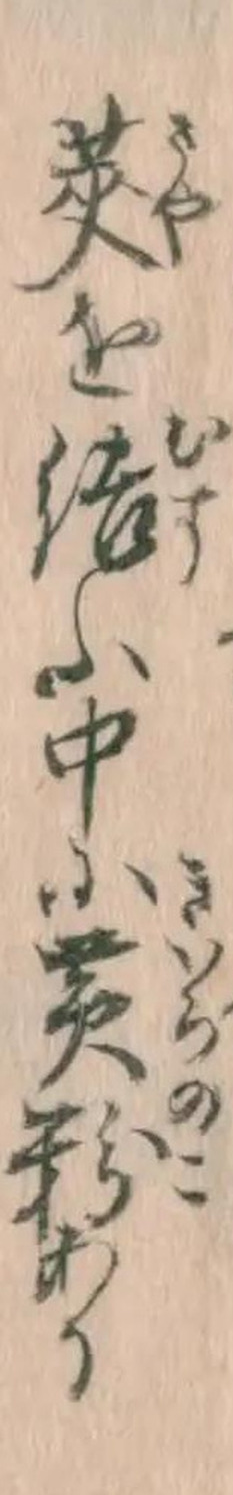莢を結ふ中に黄粉あり
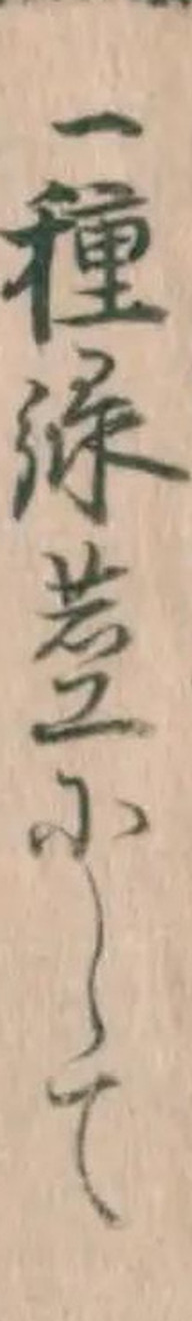一種緑茎にして
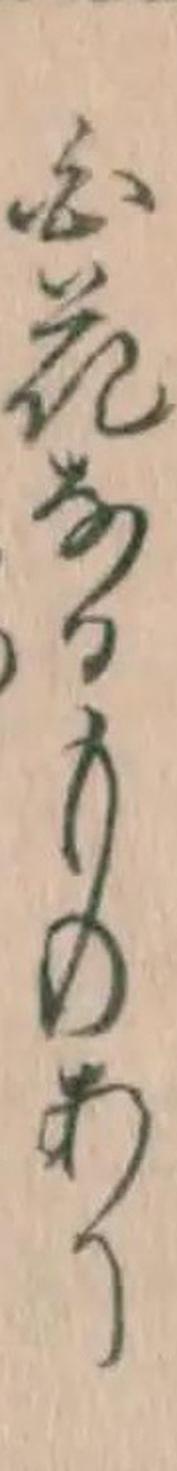白花なるものあり
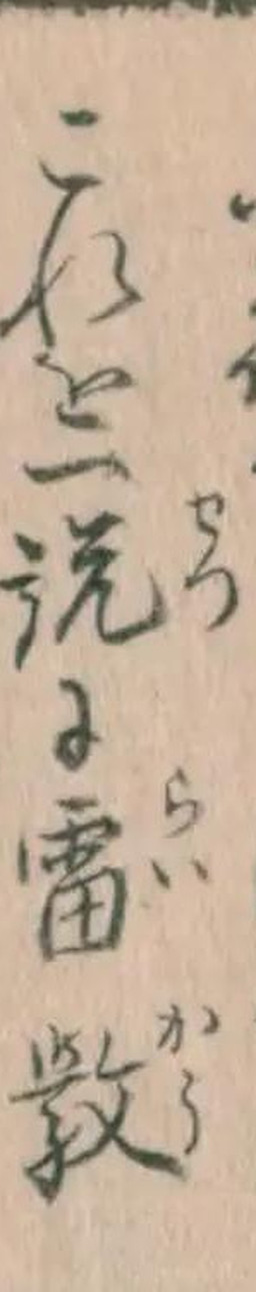これを一説に雷斆
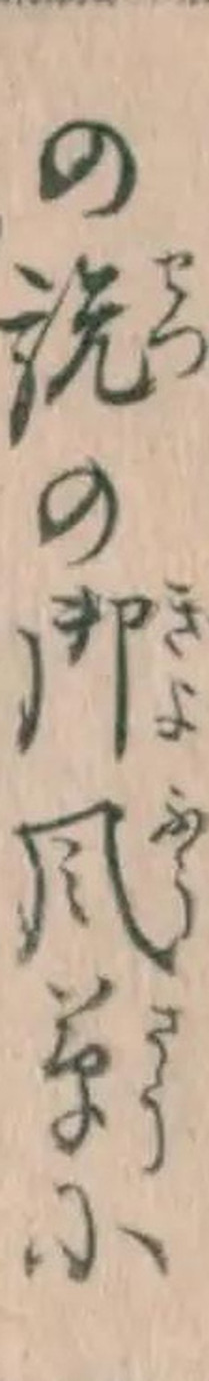の説の御風草に
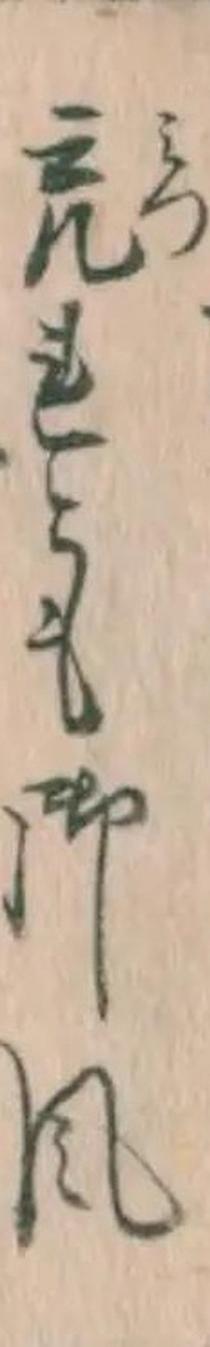充れとも御風
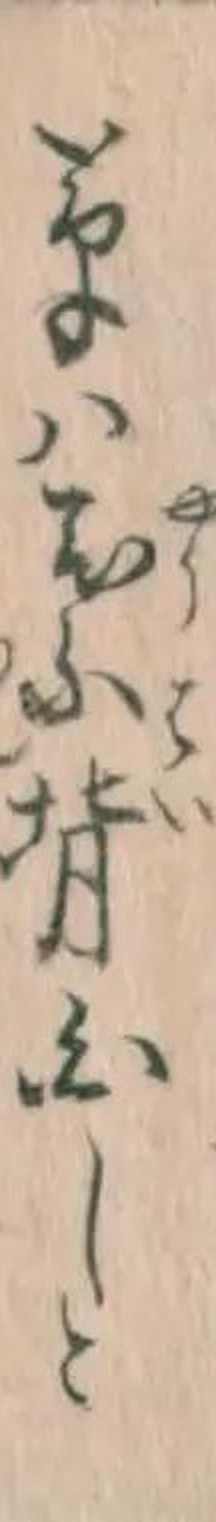草は葉背白しと
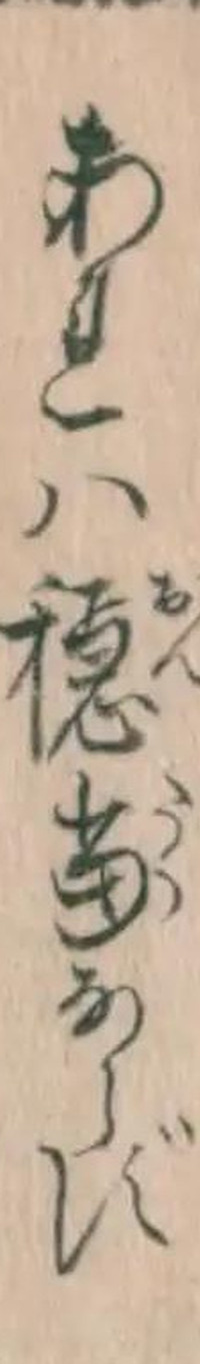あれは穏当ならず

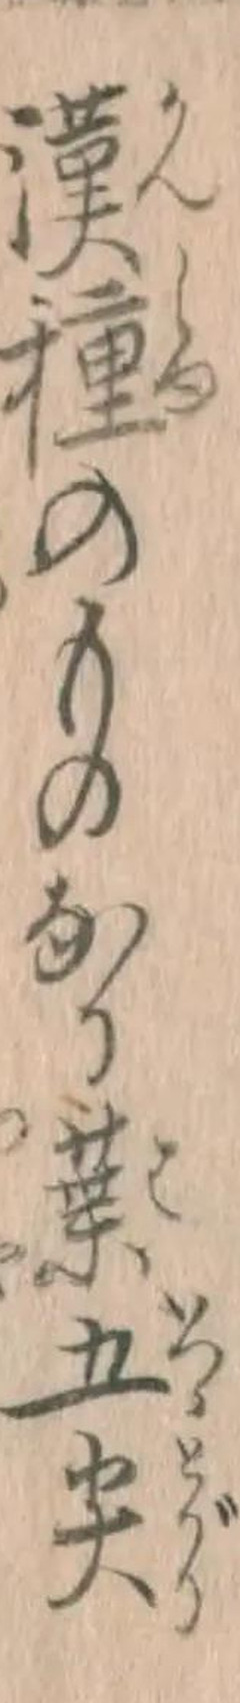漢種のものなり葉五尖
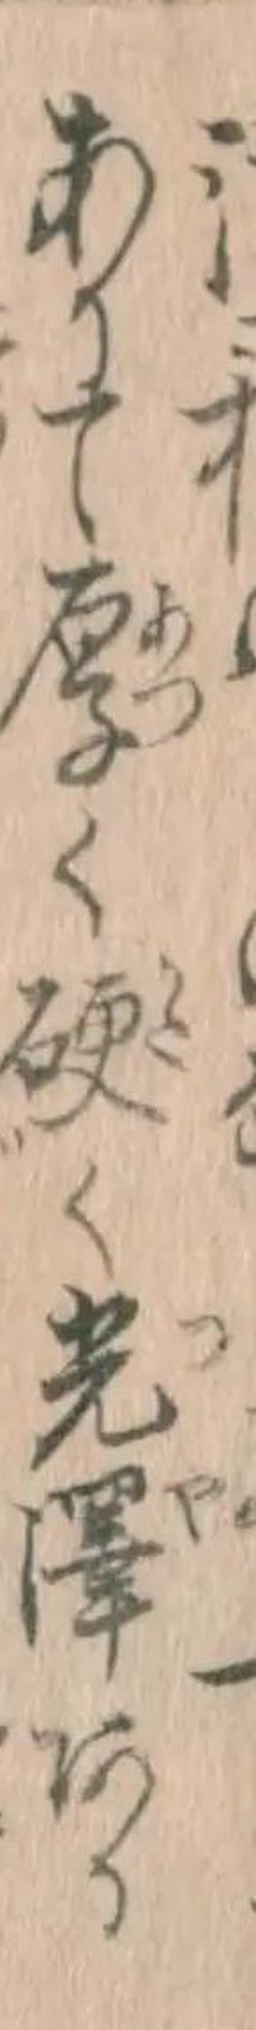ありて厚く硬く光澤あり
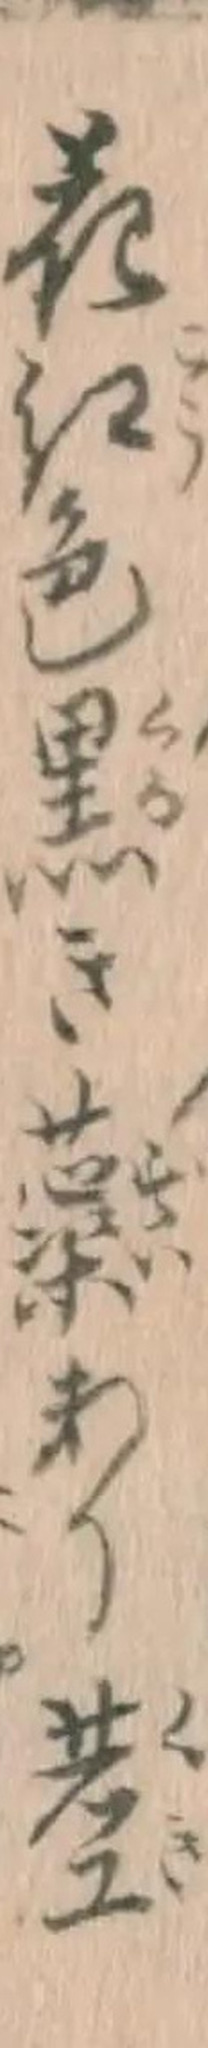花紅色黒き蕊あり茎
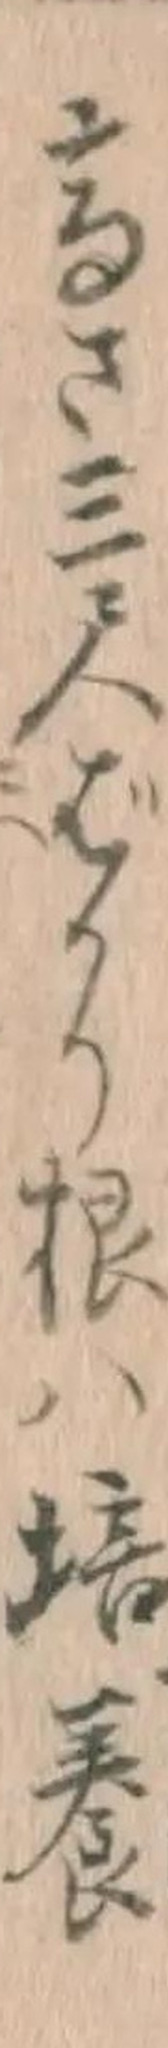高さ三尺ばかり根は培養
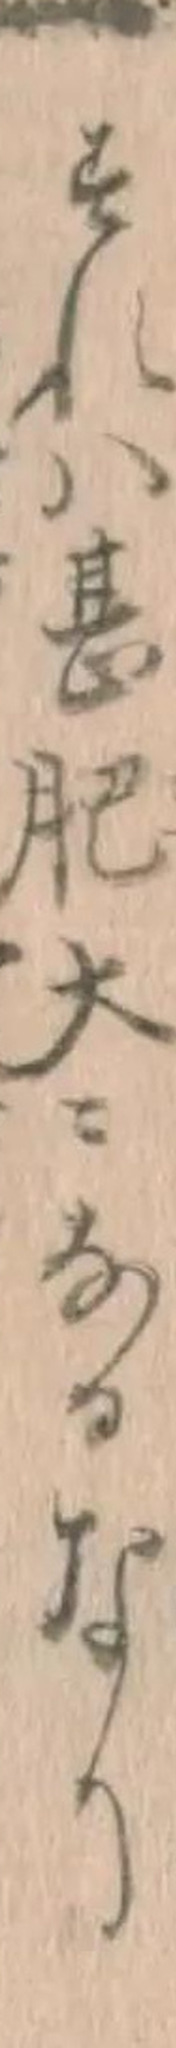すれは甚肥大になるなり
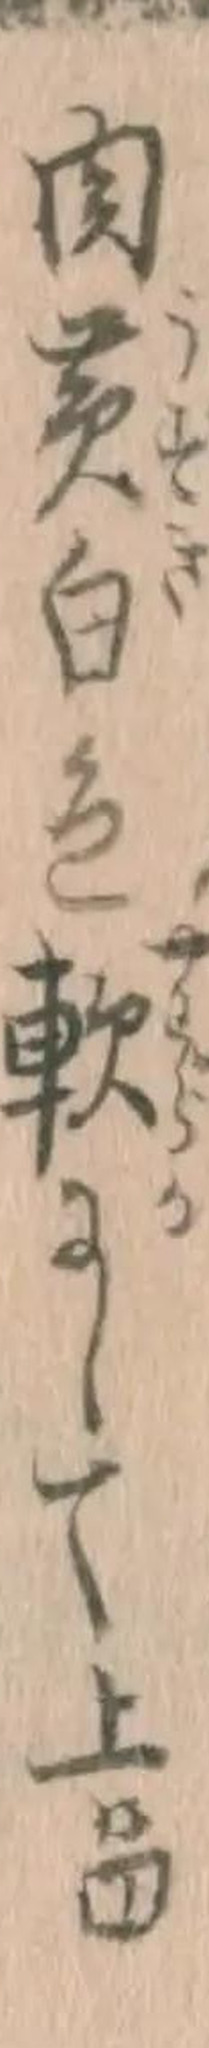肉黄白色軟にして上品
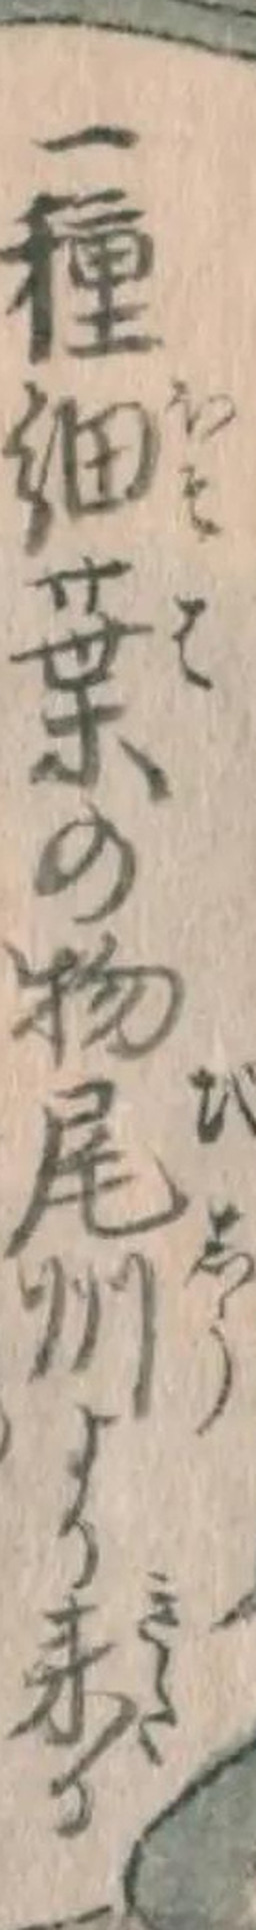一種細葉の物尾州より来る
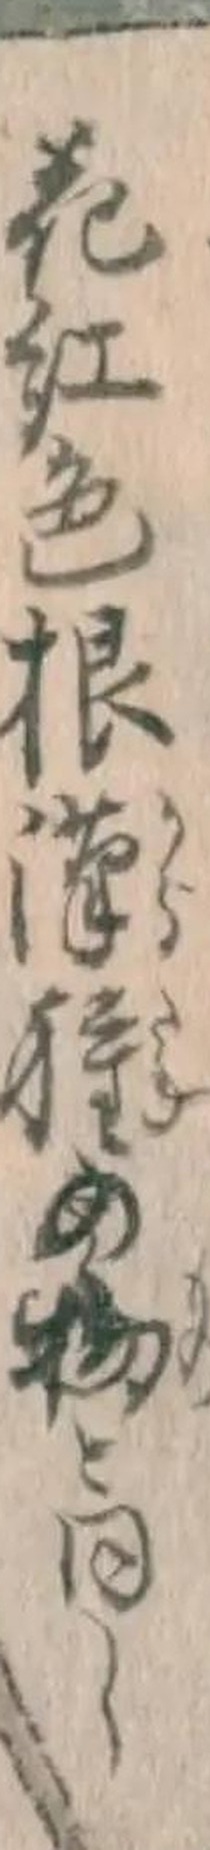花紅色根漢種の物と同じ
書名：本草図譜. 巻5-6
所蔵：国立国会図書館 National Diet Library, JAPAN
